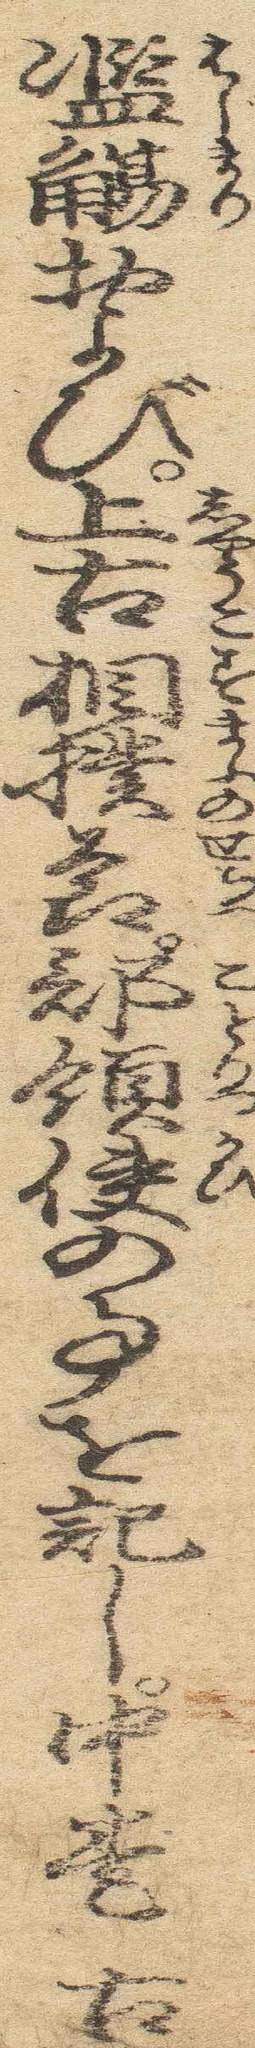濫觴および。上古相撲節。部領使の事を記し。中巻古
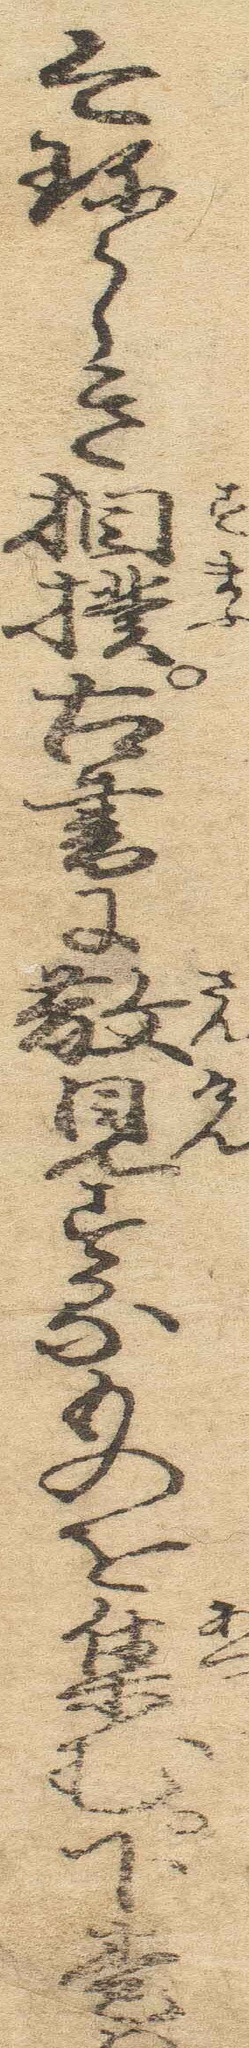今珍らしき相撲。古書に散見するものを集む。下巻は
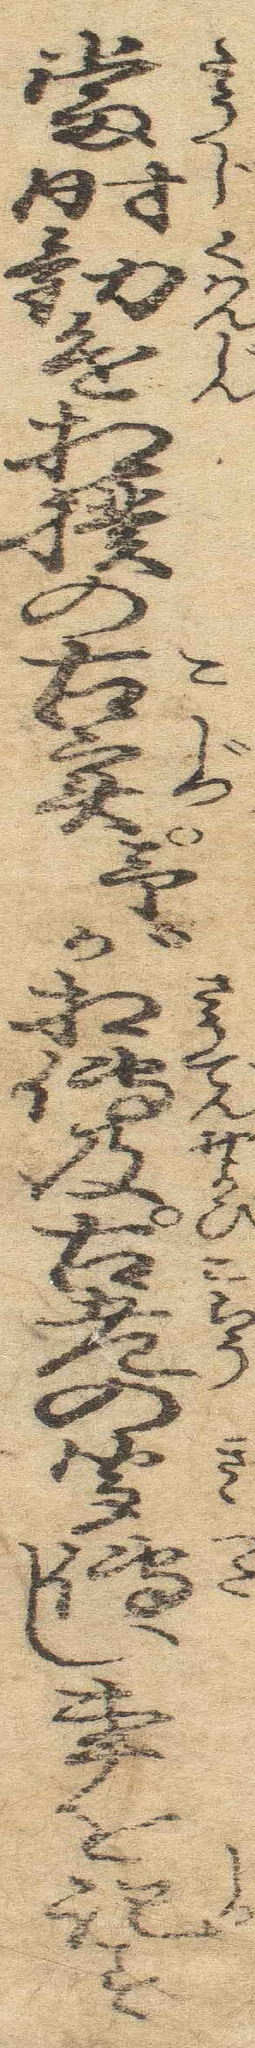当時勧進相撲の古実。予が相伝及。古老の聞伝へし事を記す
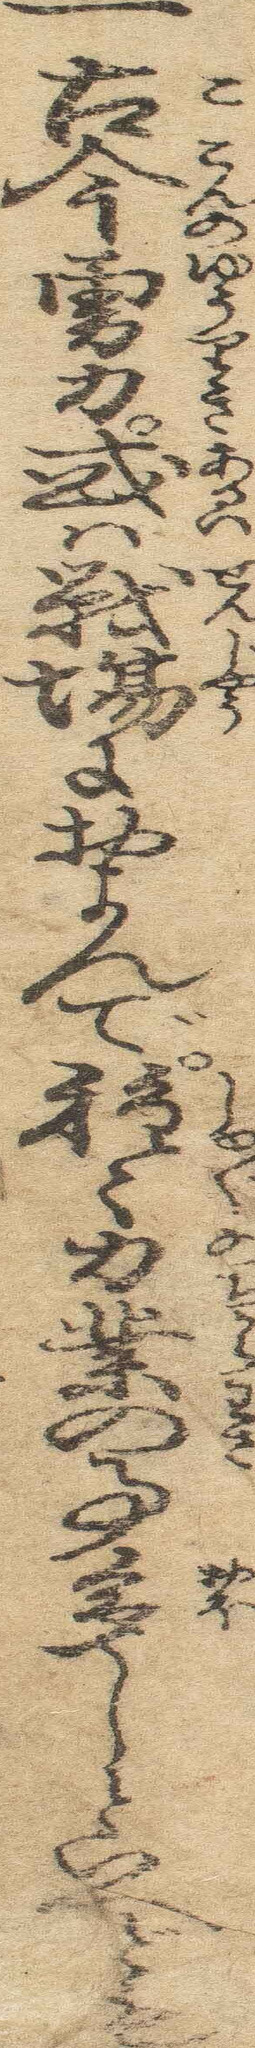一古今勇力。或は戦場におよんで。種々力業の事多しといへども
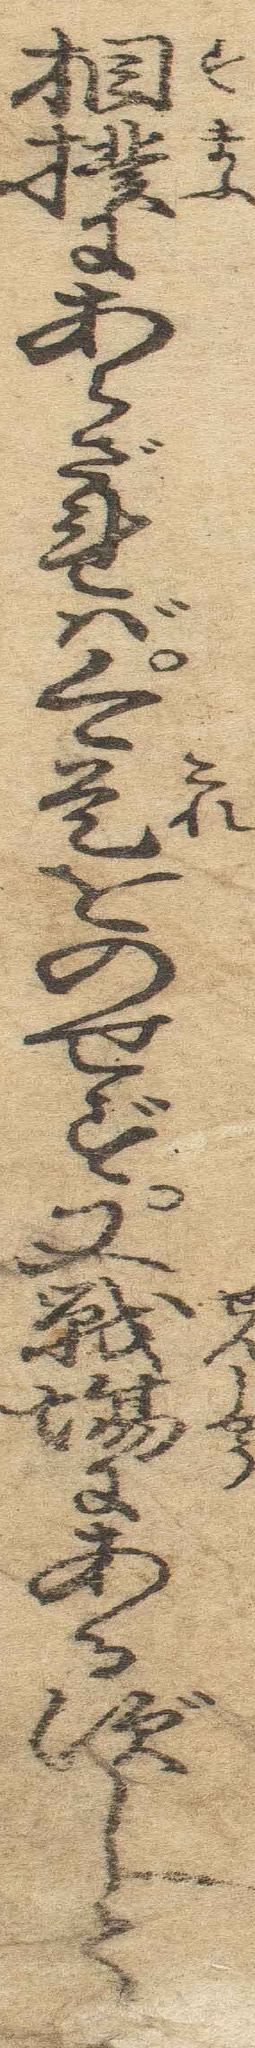相撲にあらざれば。今是をのせず。又戦場にあるずして
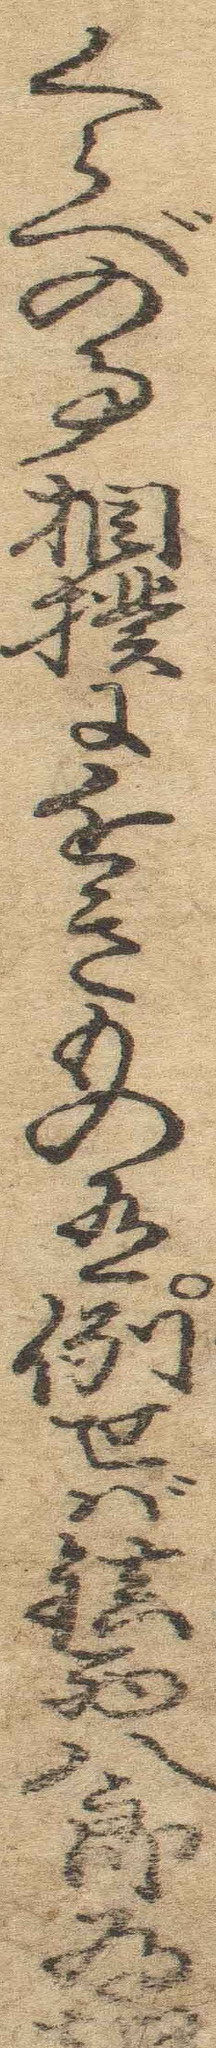くらべの事相撲に近きもの有。例せば鎮西八郎為朝。
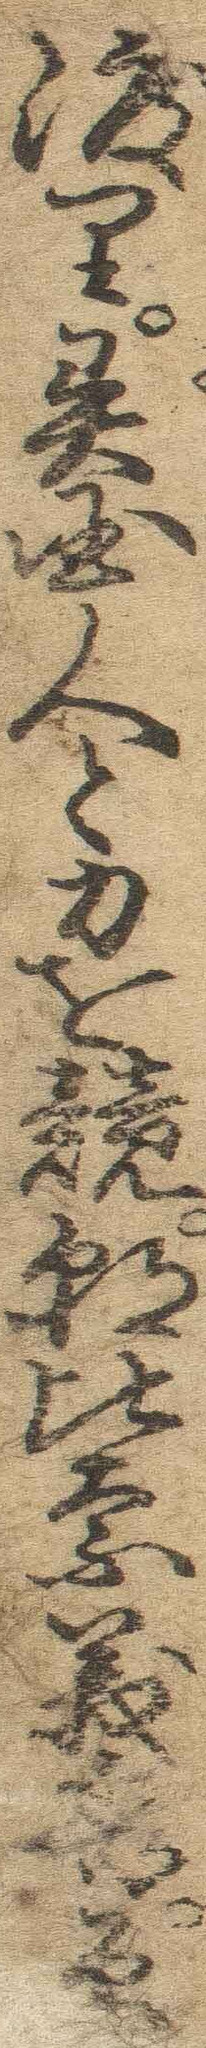渡り。異国人と力を競。朝比奈義秀。力を

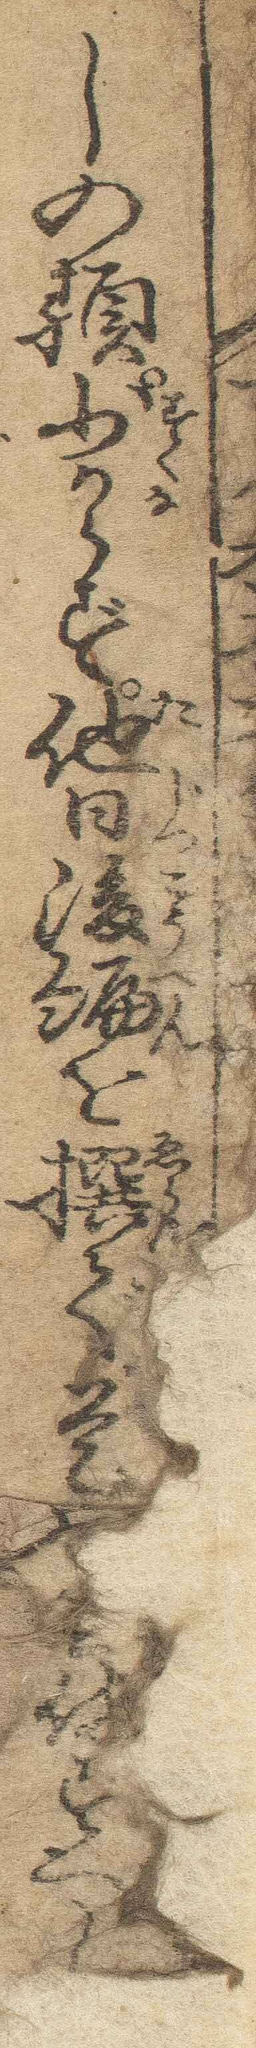しの類。少からず。他日後編を撰で。是備すべし
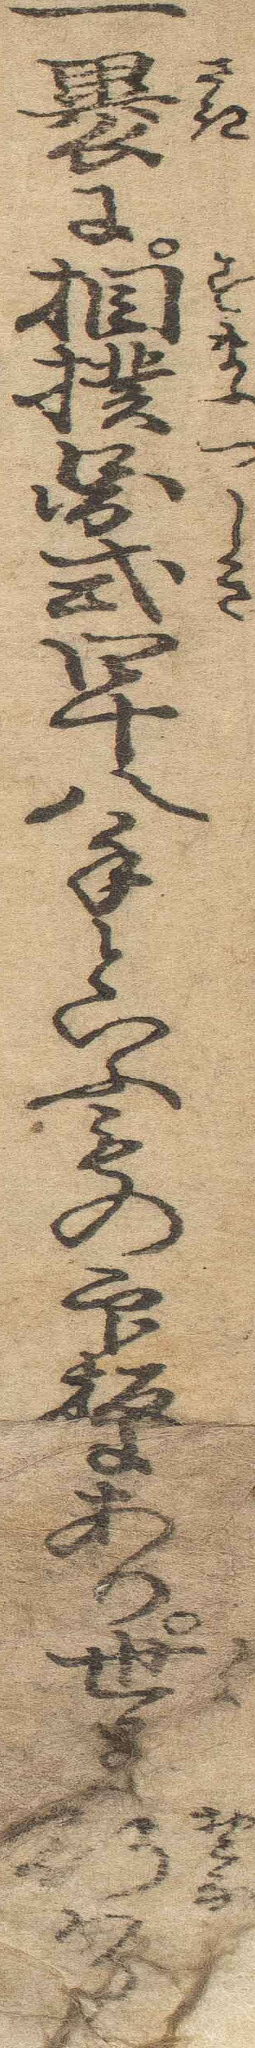一曩に。相撲図式四十八手といふもの印板にあり。世に行はるゝ
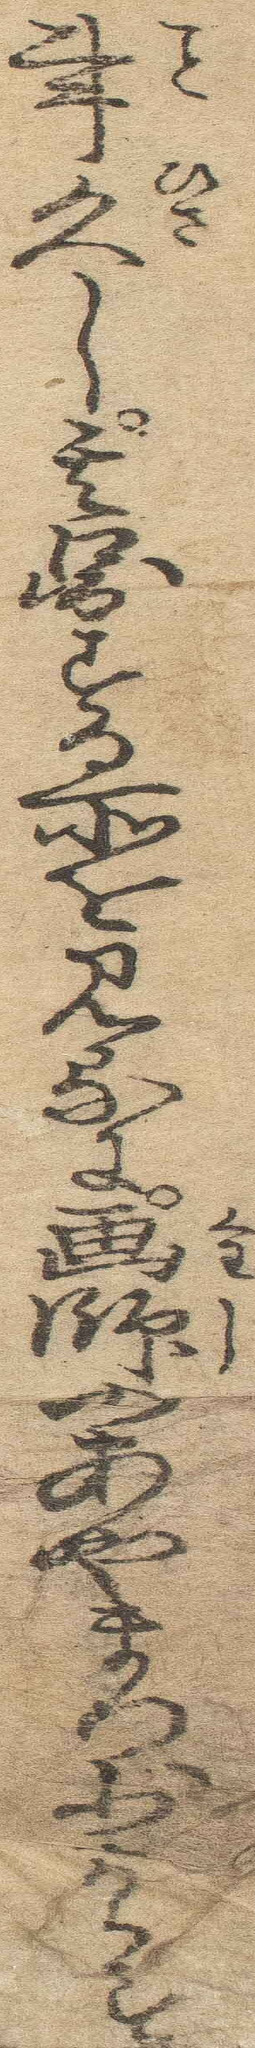事久し。其図する所を見るに。画師のあやまり少からす
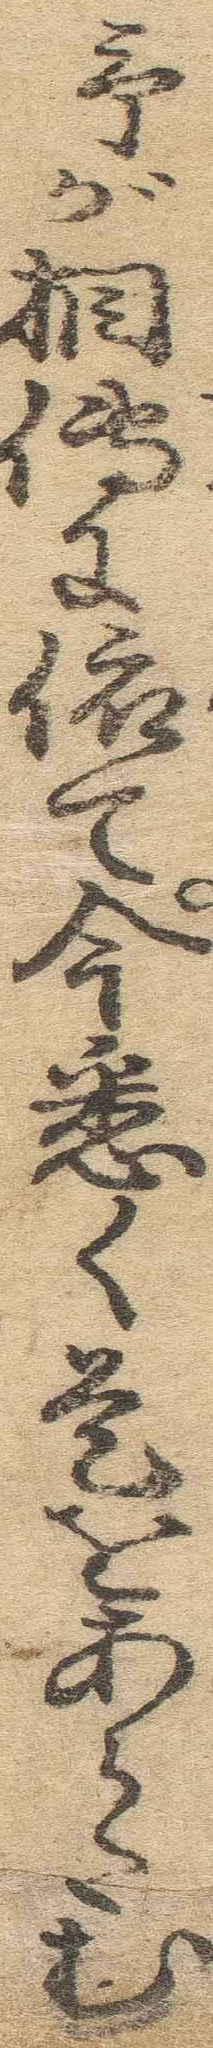予が相伝に依て。今悉く是をあらたむ
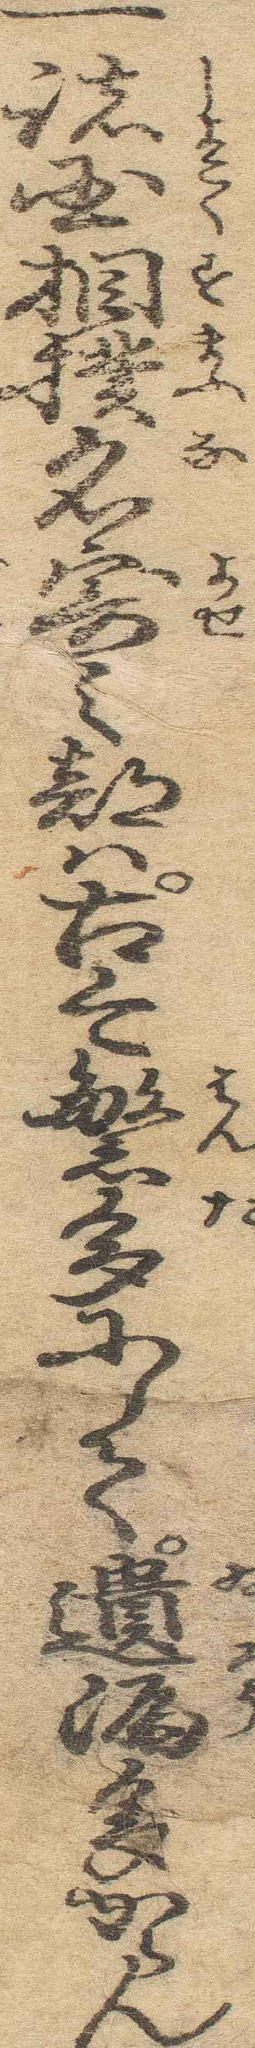一諸国相撲名寄之部は。古今繁多にして。遺漏多からん
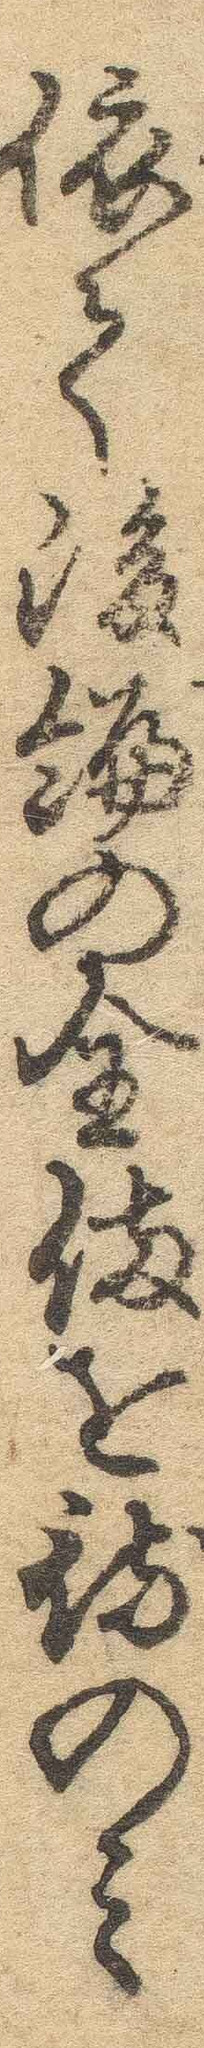依て後編の全備を待のみ
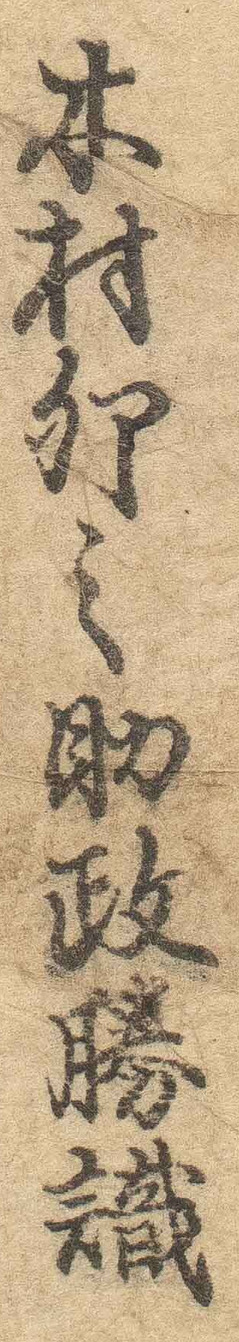木村卯之助政勝識
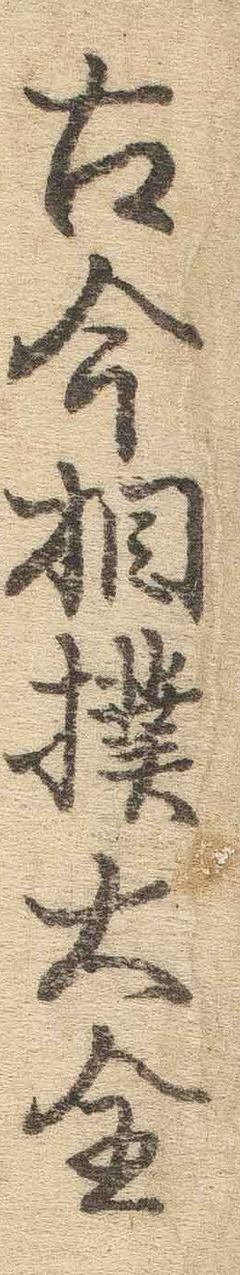古今相撲大全
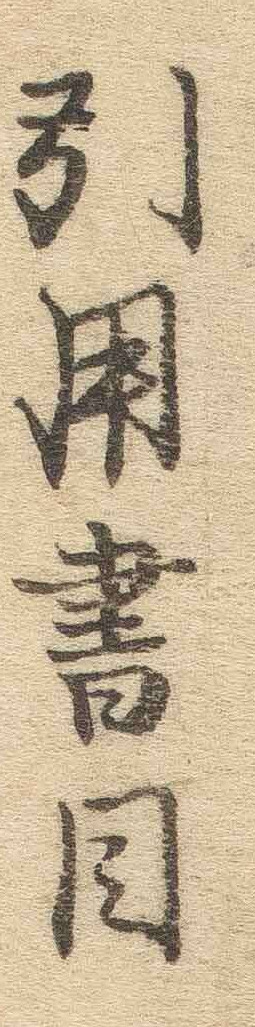引用書目
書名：古今相撲大全
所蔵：東京学芸大学附属図書館 国文学研究資料館
